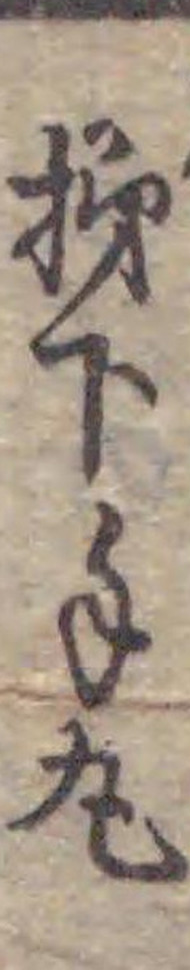柿下手丸
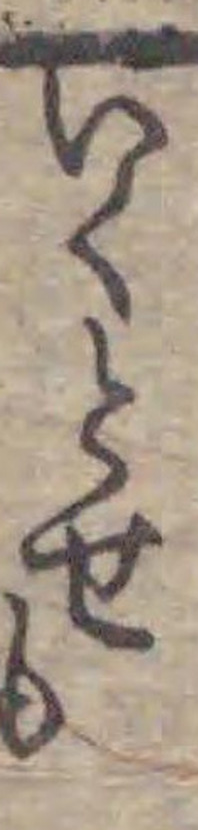いくとせも
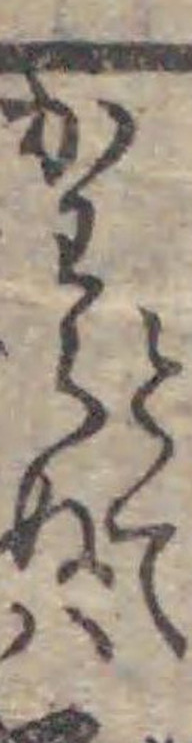かわらぬは
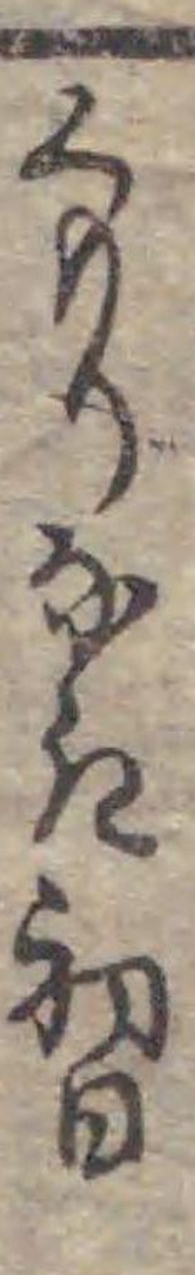くもりなき初日
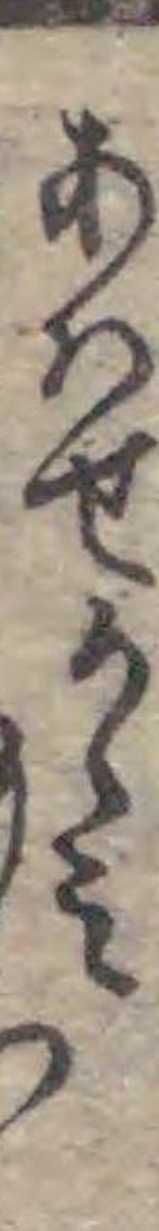あはせかゝみ
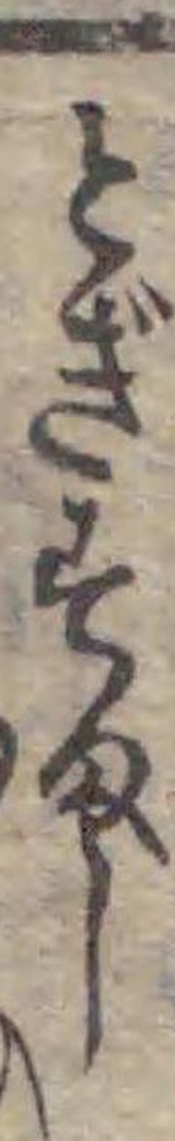とぎすまし
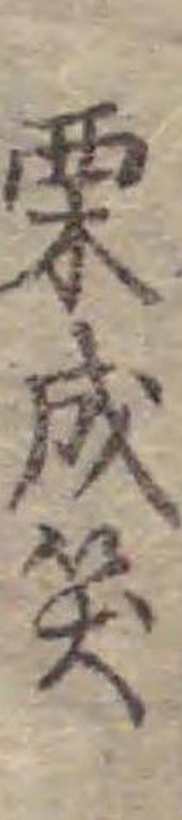栗成笑
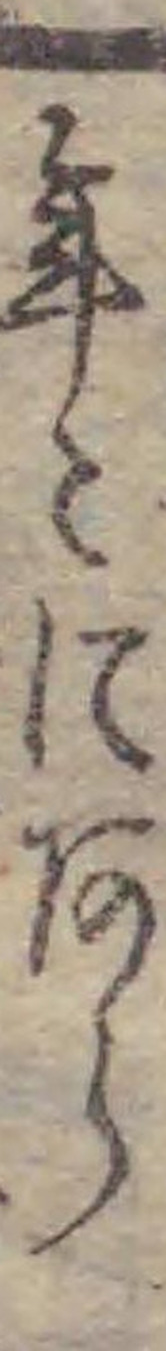年々にあら
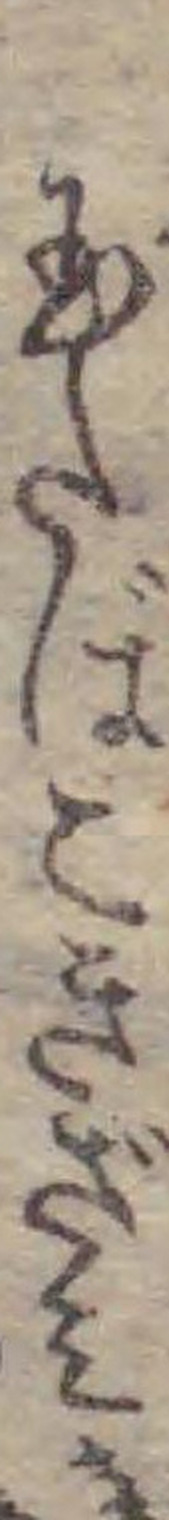玉たばこきざみ
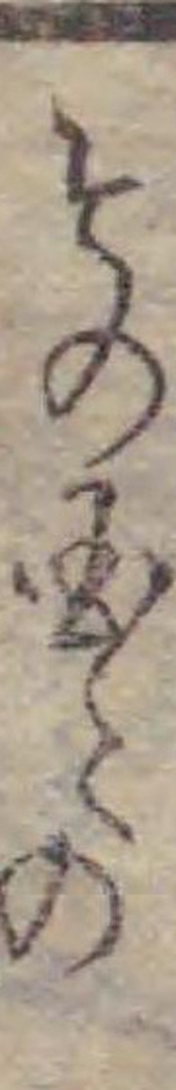その国々の
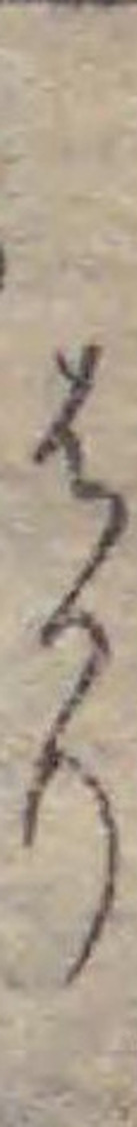はかり
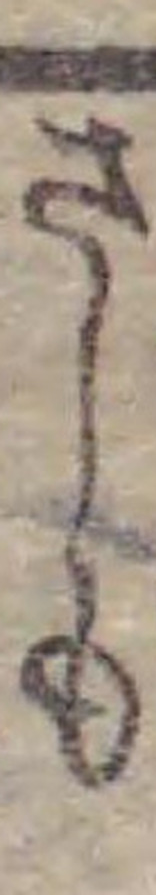さしも
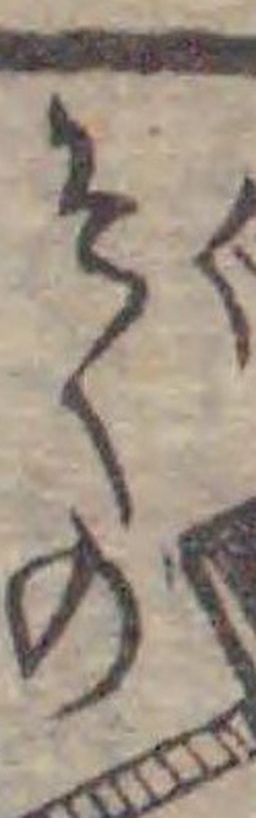そくの
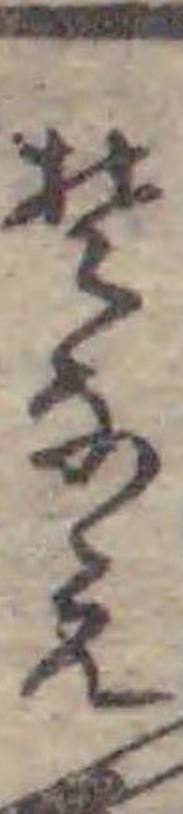そなえ
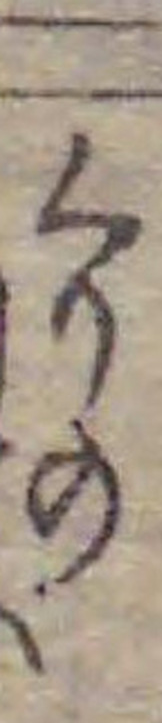くりの
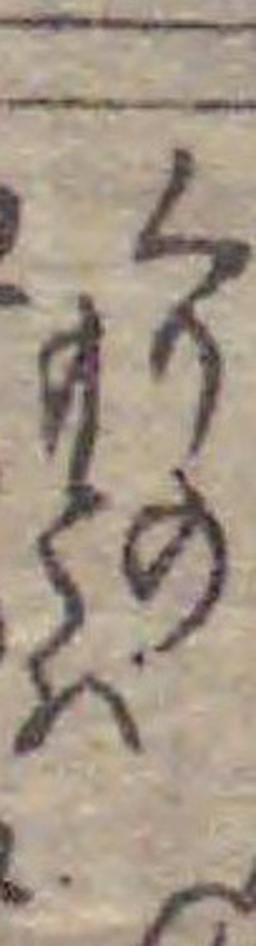もとは
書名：年始御礼帳 : 3巻
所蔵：国立国会図書館 National Diet Library, JAPAN
